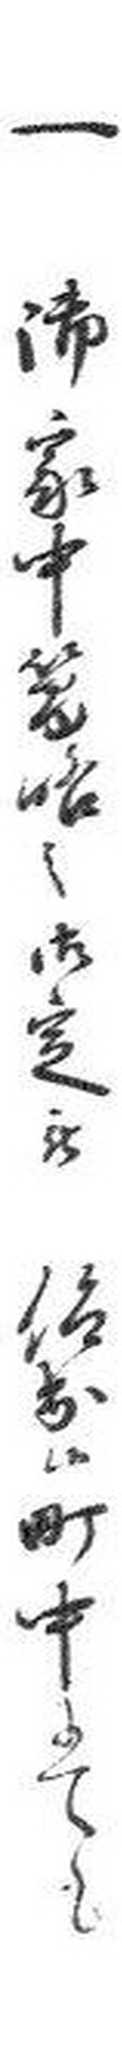一御家中簡略之御定被仰出候町中にても
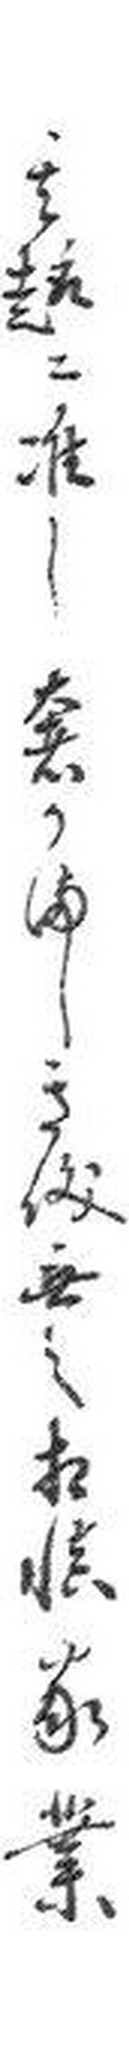其趣ニ准し奢かましき儀無之相慎家業
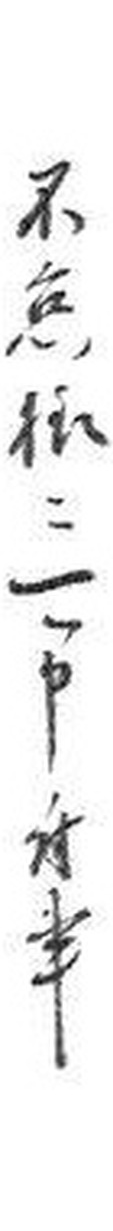不怠様ニ可申付事
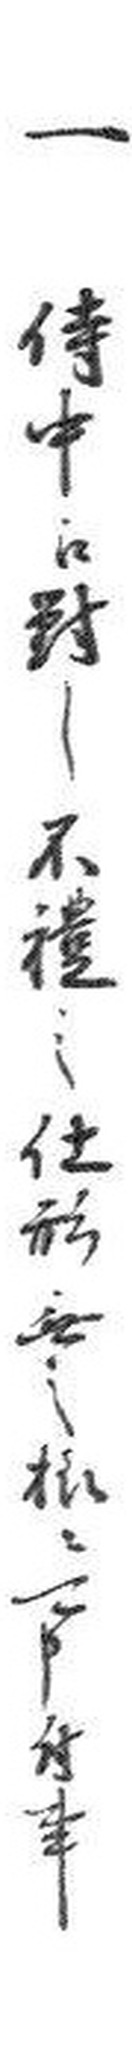一侍中江対し不礼之仕形無之様ニ可申付事
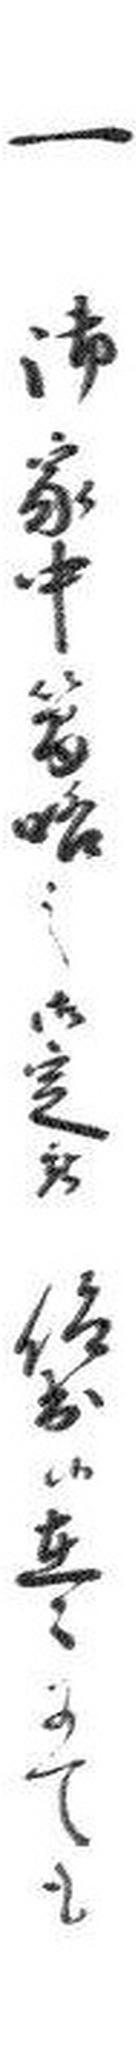一御家中簡略之御定被仰出候在々にても
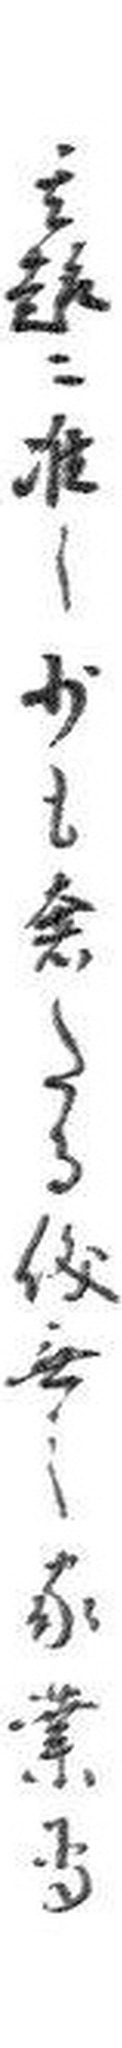其趣ニ准し少も奢たる儀無之家業専
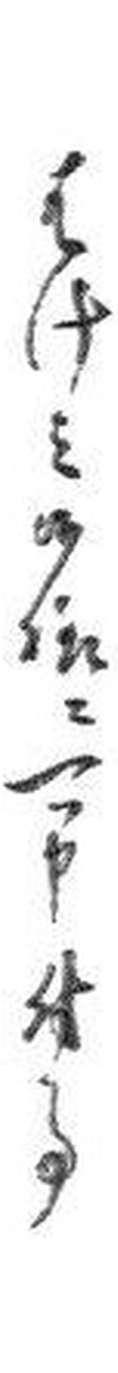はけミ候様ニ可申付事
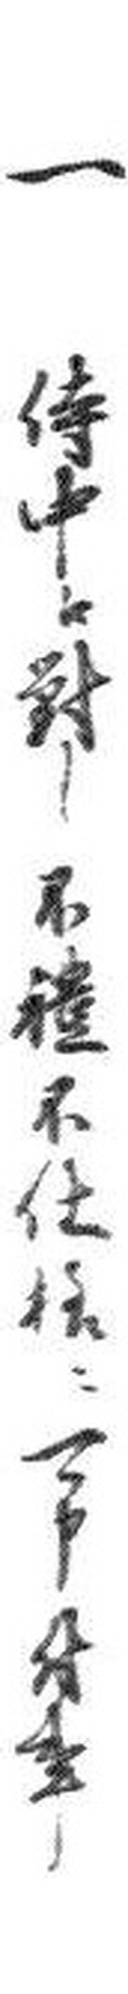一侍中江対し不礼不仕様ニ可申付事
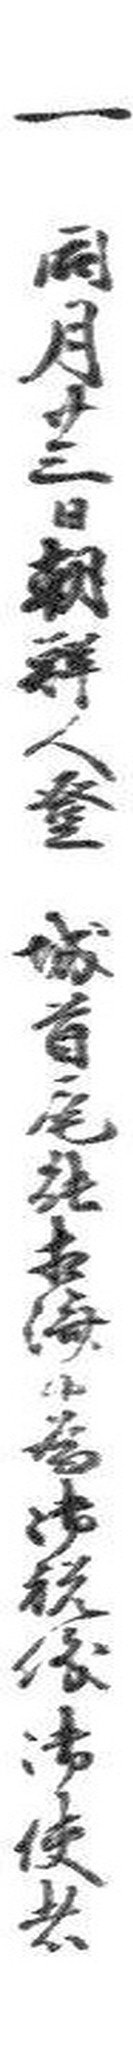一同月廿三日朝鮮人登城首尾能相済候為御祝儀御使者
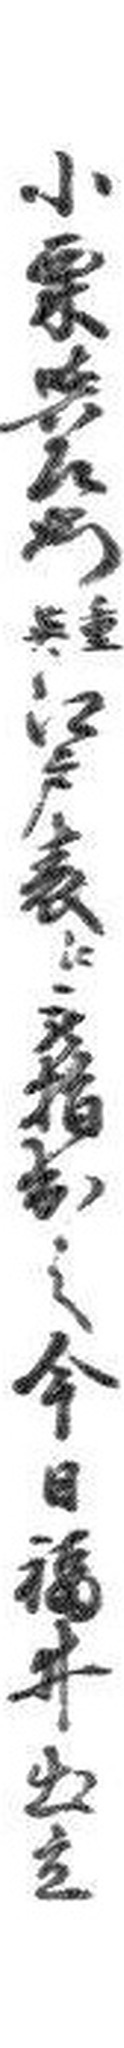小栗与左衛門重英江戸表江被指出之今日福井出立
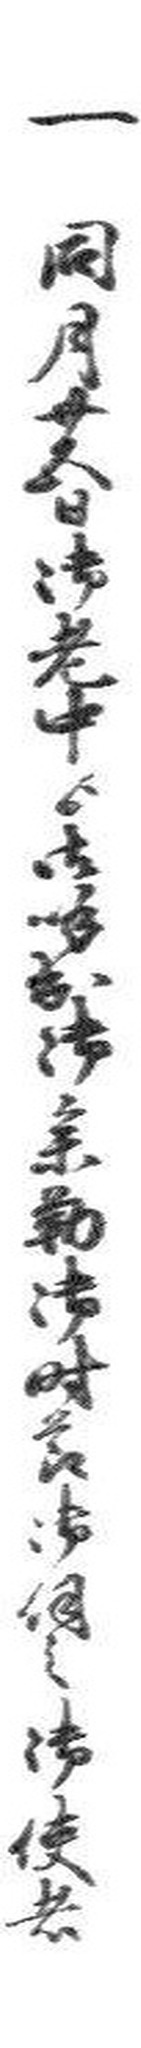一同月廿五日御老中ゟ御呼出御参勤御時節御伺之御使者
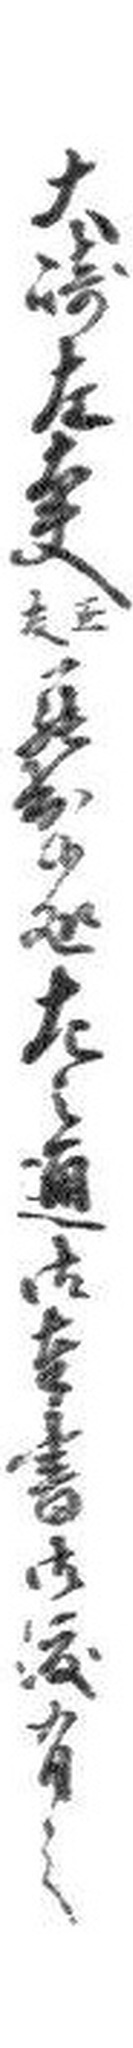大崎左大夫正友罷出候処左之通御奉書御渡有之
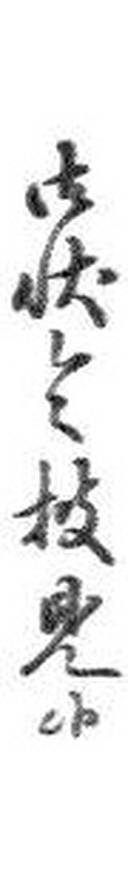御状令披見候

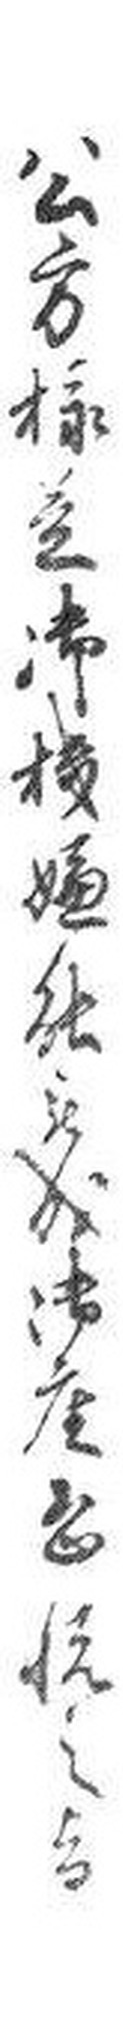公方様益御機嫌能被成御座恐悦之旨
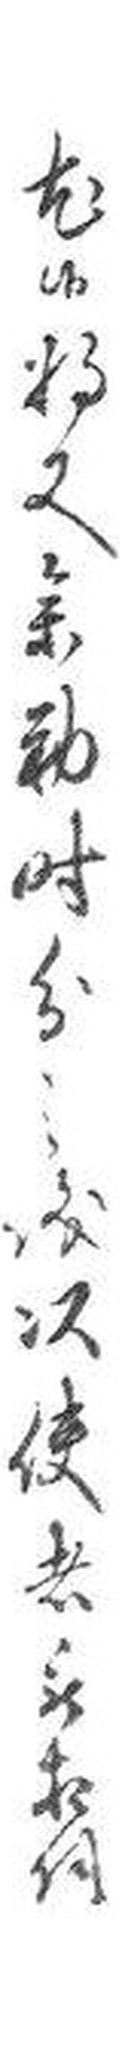尤候将又参勤時分之儀以使者被相伺
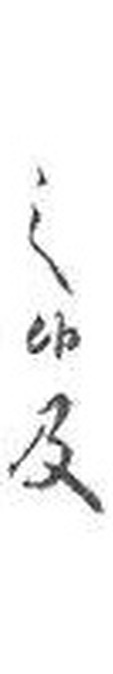之候及
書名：家譜 二十八 吉邦公 従宝永七年七月五日到正徳元年十二月
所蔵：福井県文書館 Fukui Prefectural Archives
